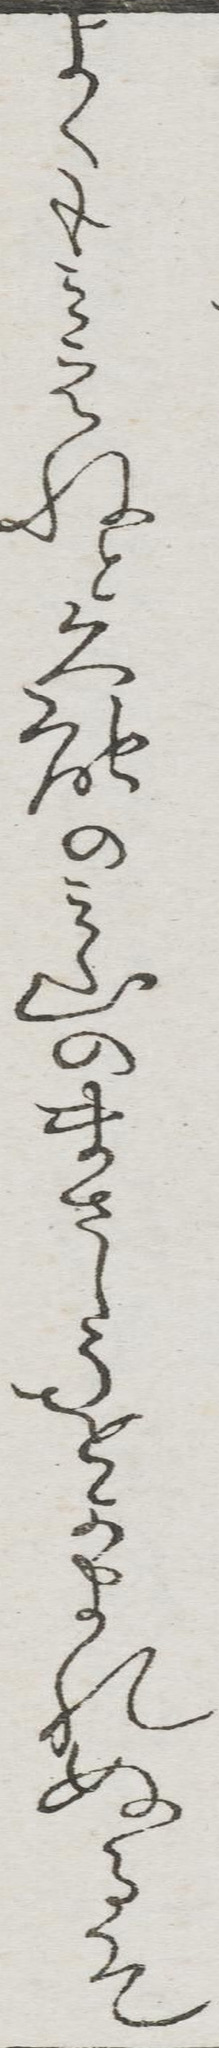よくもみえねと久能のみ山のまさしうをかまれぬるそ
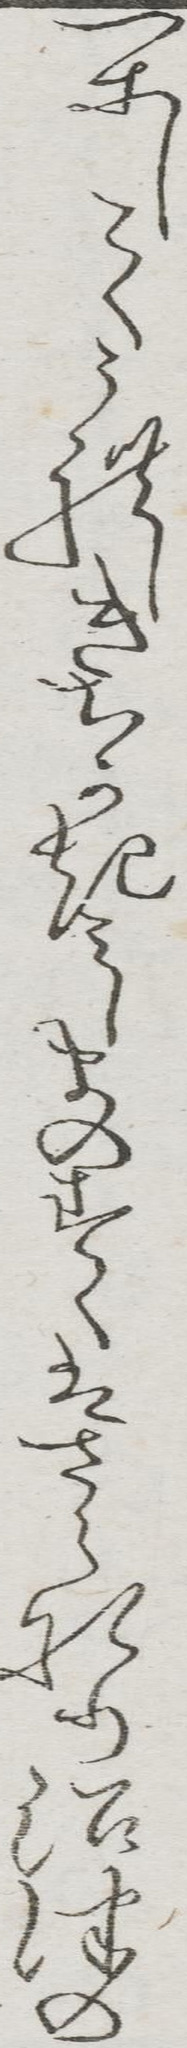かしこくうれしきちかきみしまのすくはさらなり沼津の
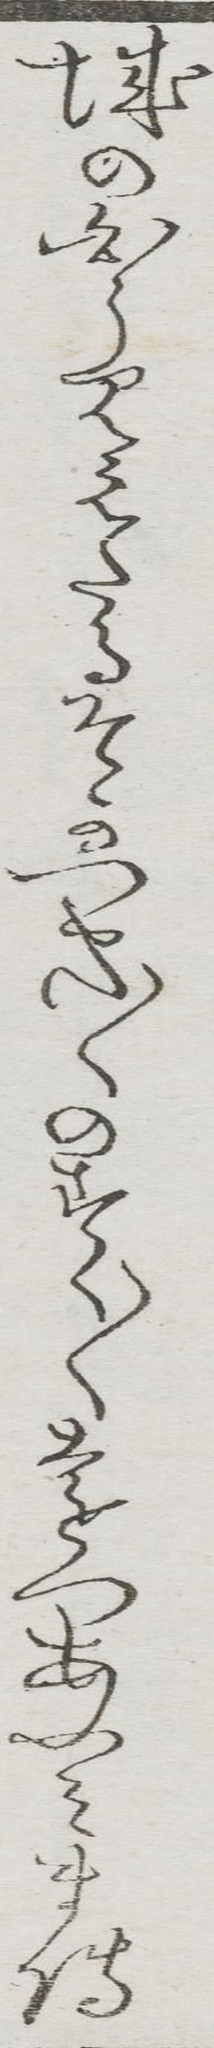城の白う見えたるそかつき〳〵のすく〳〵遠つあふみまて
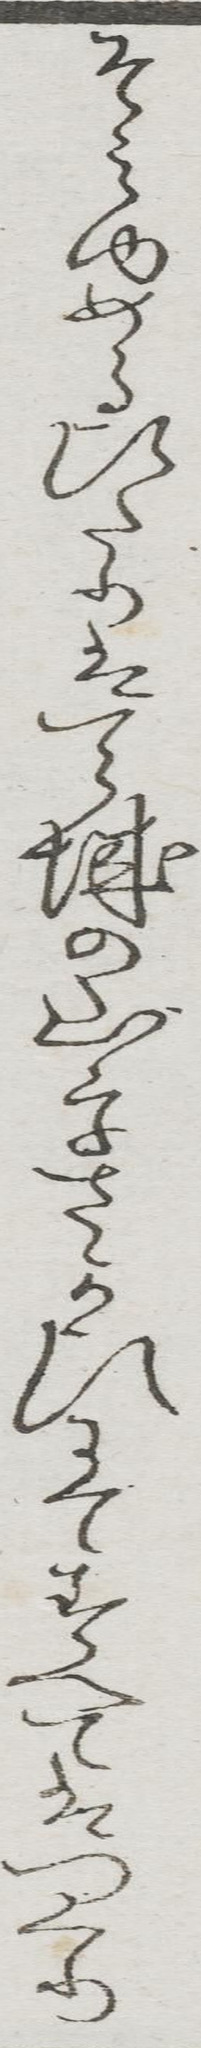そみゆめるひたりは天城の山をさかひにてすへてはつくり
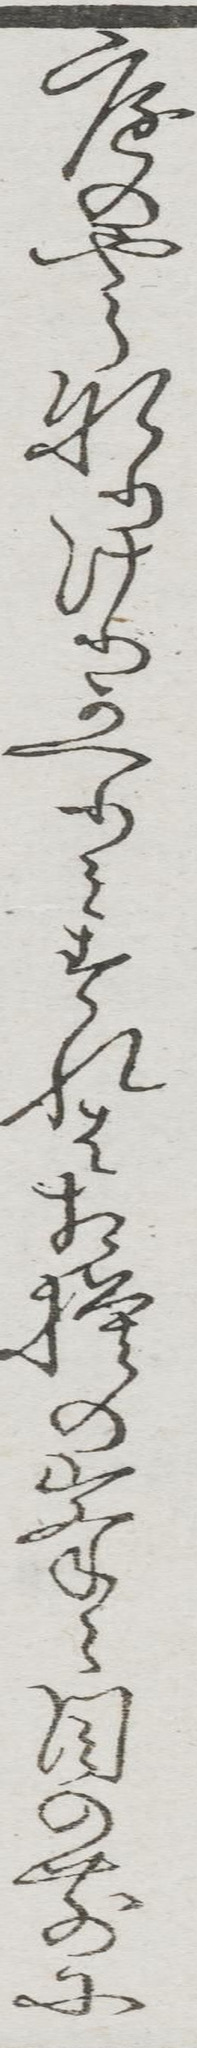庭のやうなりけりかへりみすれは相模の峯々目の前に
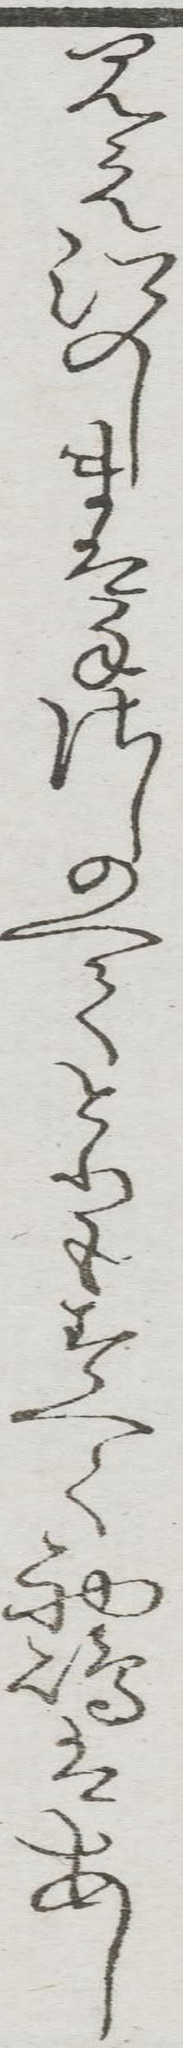見え江のしまは手さしのへてとりもすへく初嶋はあし
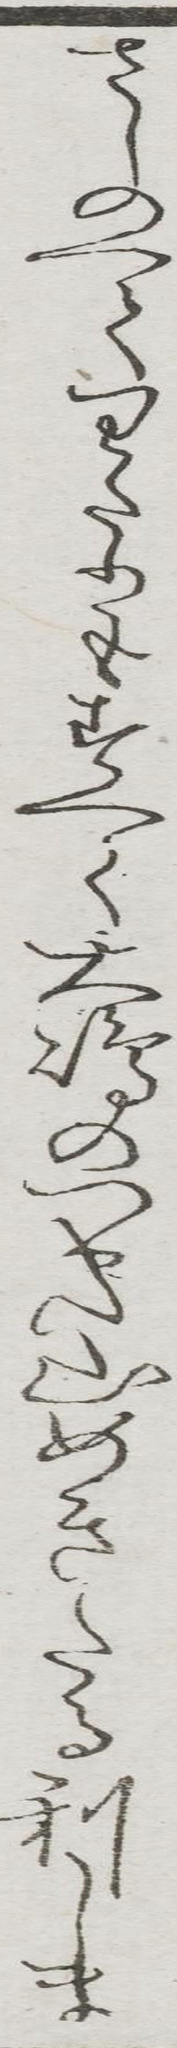さしのへてわたりもすへく大嶋のつき山めきたる利しま
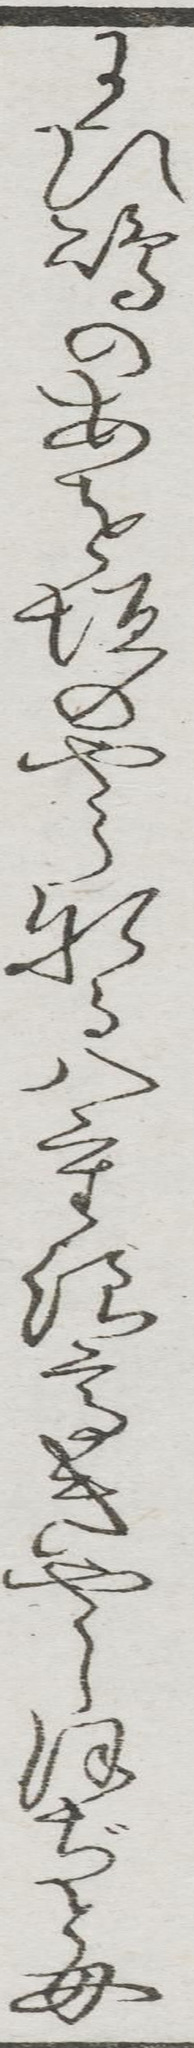にひ嶋のあを垣のやうなる八重浪高きやしほぢとも
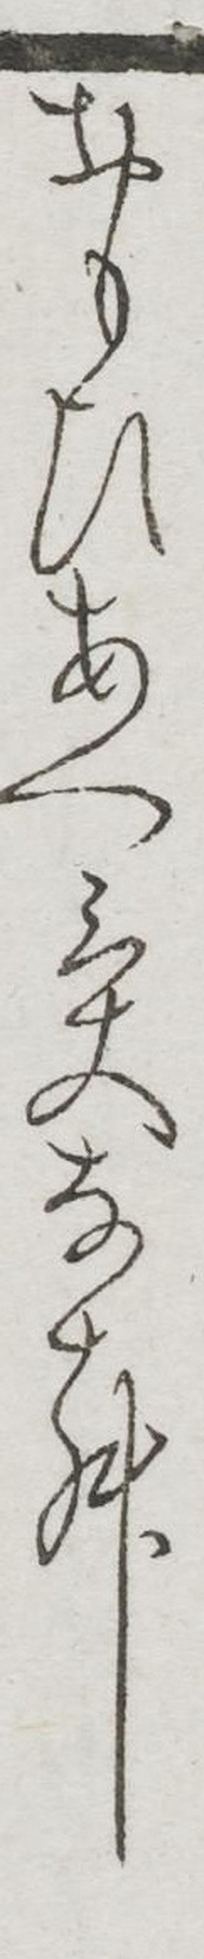おもひあへすなむ
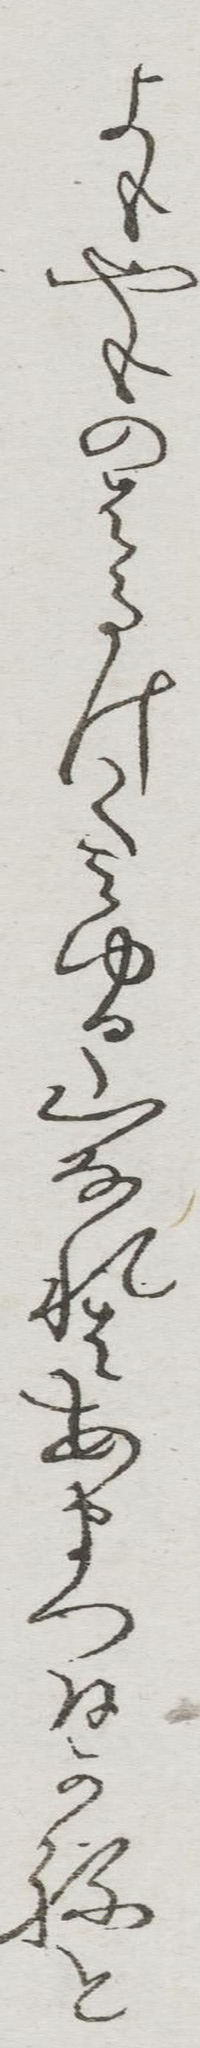よもやものはるけくみゆる山なれはあまつ日かねと
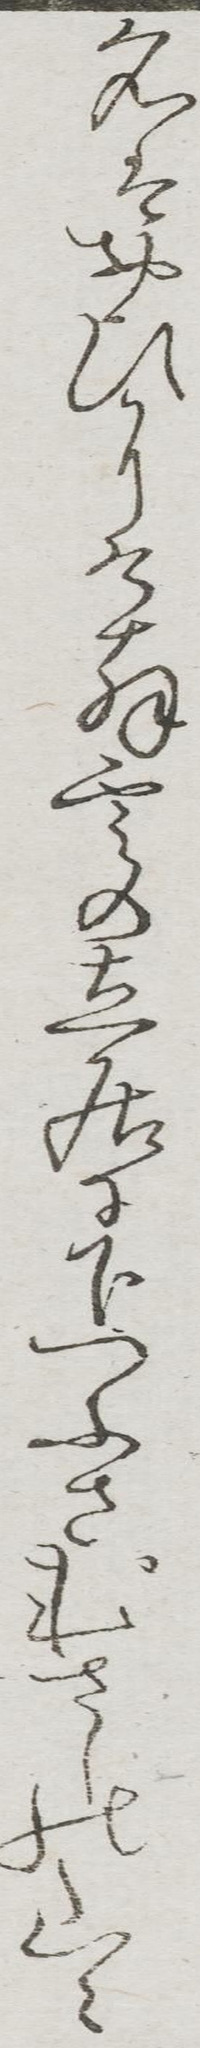名はおひにけむ雲の立居に下つふさむさし山々
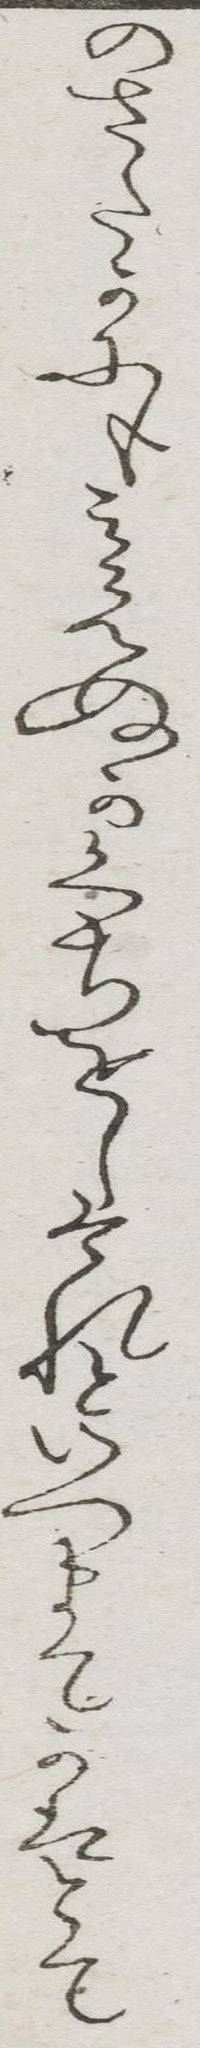のさたかにもみえぬかくちをしけれといつまてかはとて

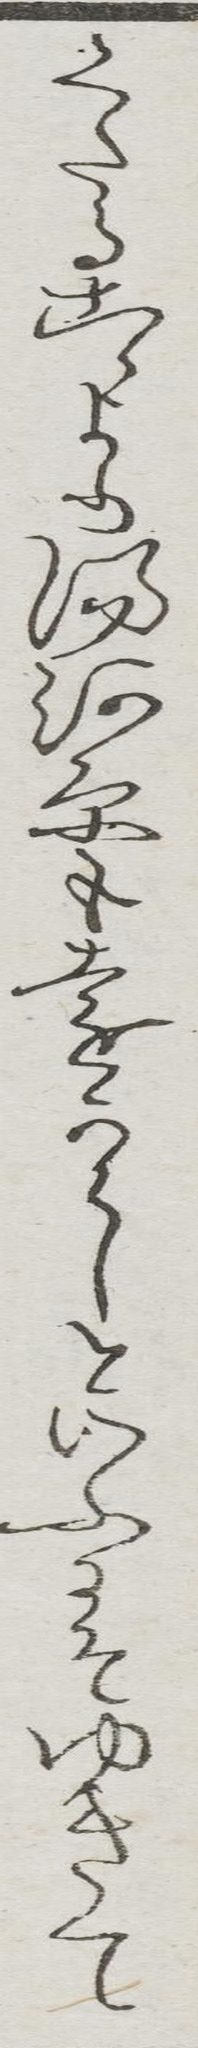くたるこゝより湯河原も遠からしといふにそゆきて
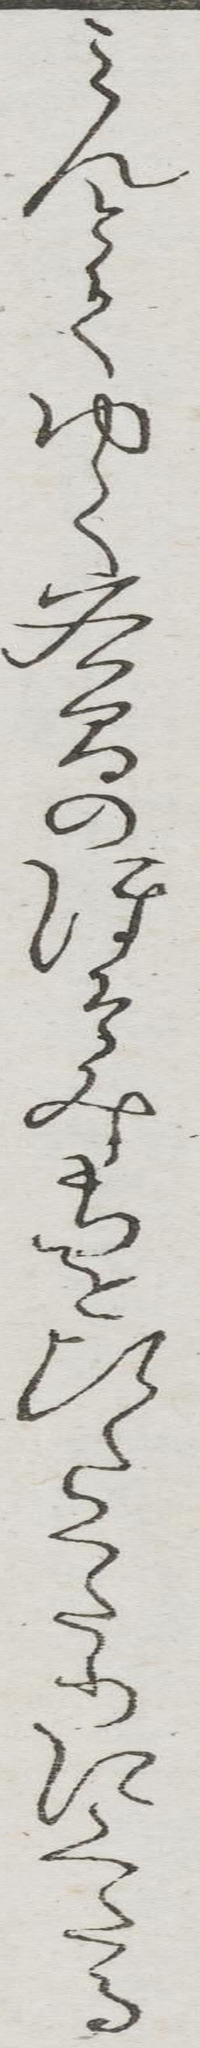みんとてゆく谷間のほそみちをひたくたりにくたる
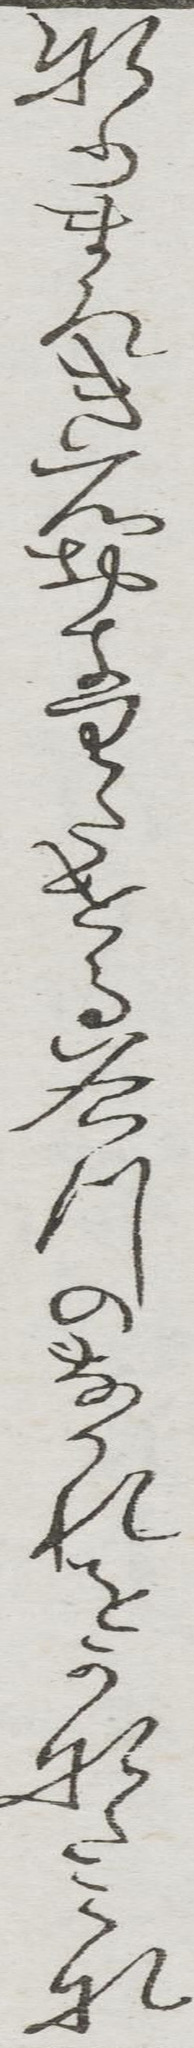なりまろき石おきわたせる谷川のなかれをかなたこな
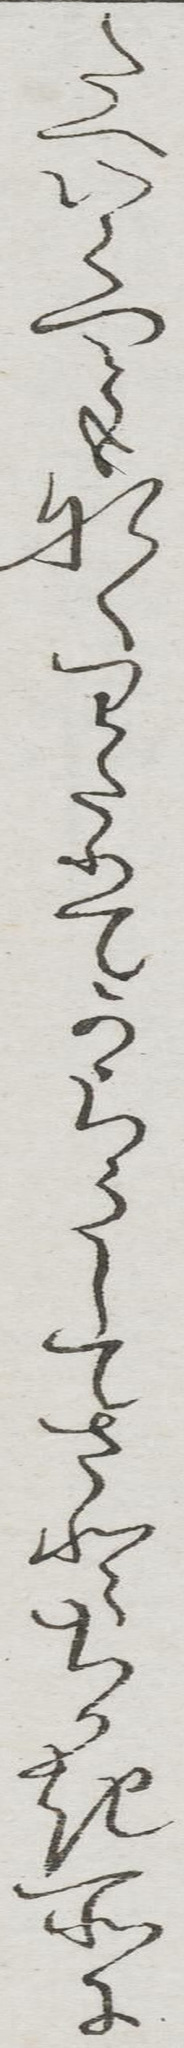たへいくつともなくわたりてからうしてさとちかき所に
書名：挿画熱海日記　全
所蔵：東京大学地震研究所図書室 Earthquake Research Institute Library, The University of Tokyo, JAPAN
